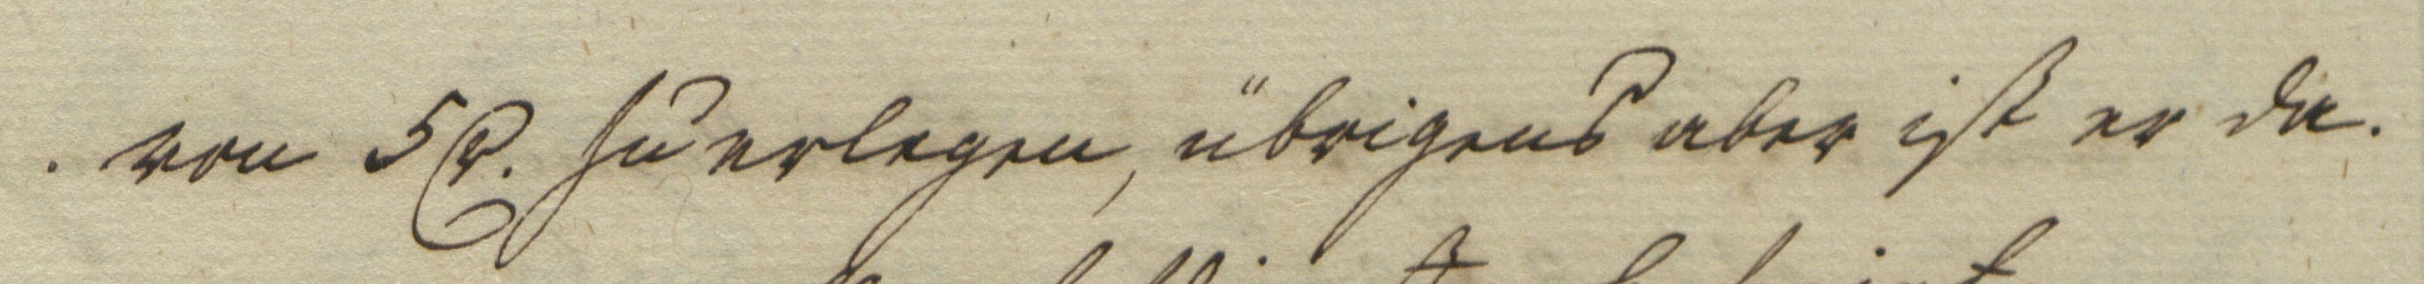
von 5 l. zuerlegen, übrigens aber ist er da¬
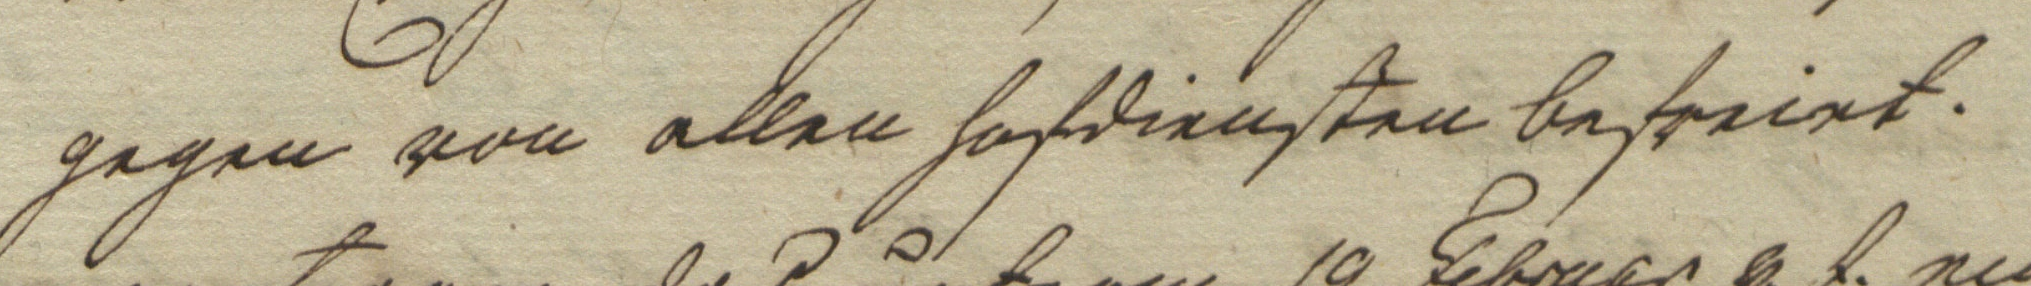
gegen von allen Hofdiensten befreiet.
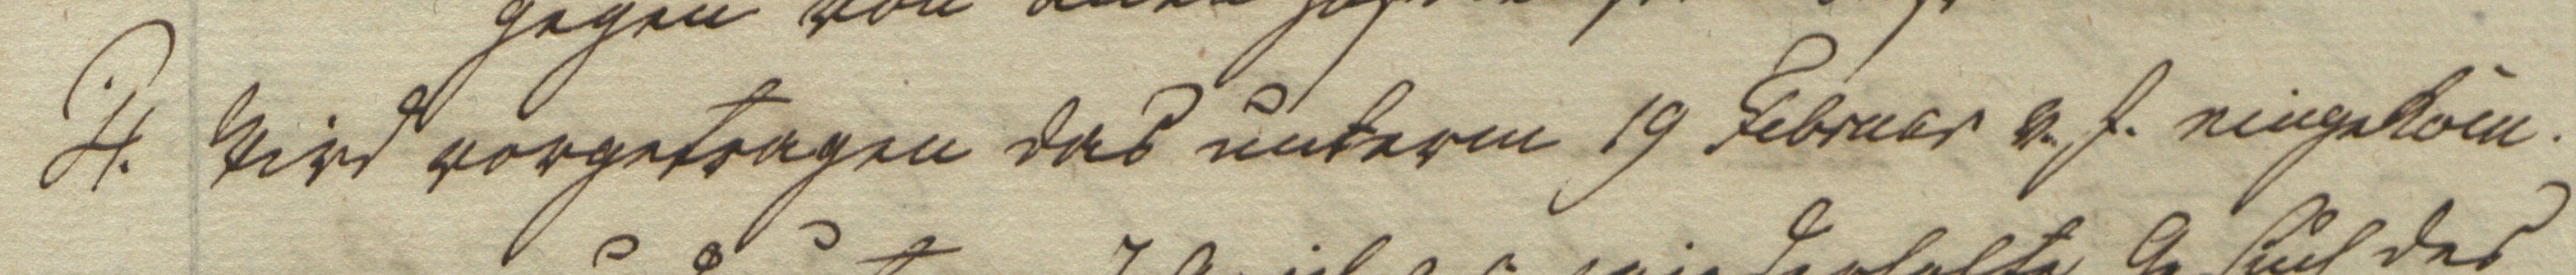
4. Wird vorgetragen das unterm 19 Februar v. J. eingekom¬
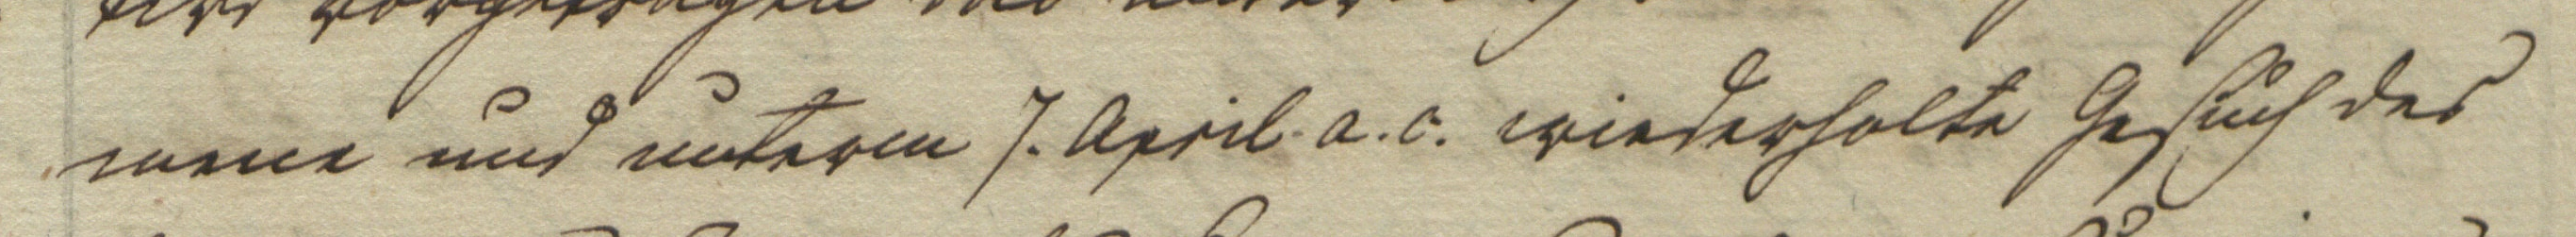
mene und unterm 7. April a. c. wiederholte Gesuch des
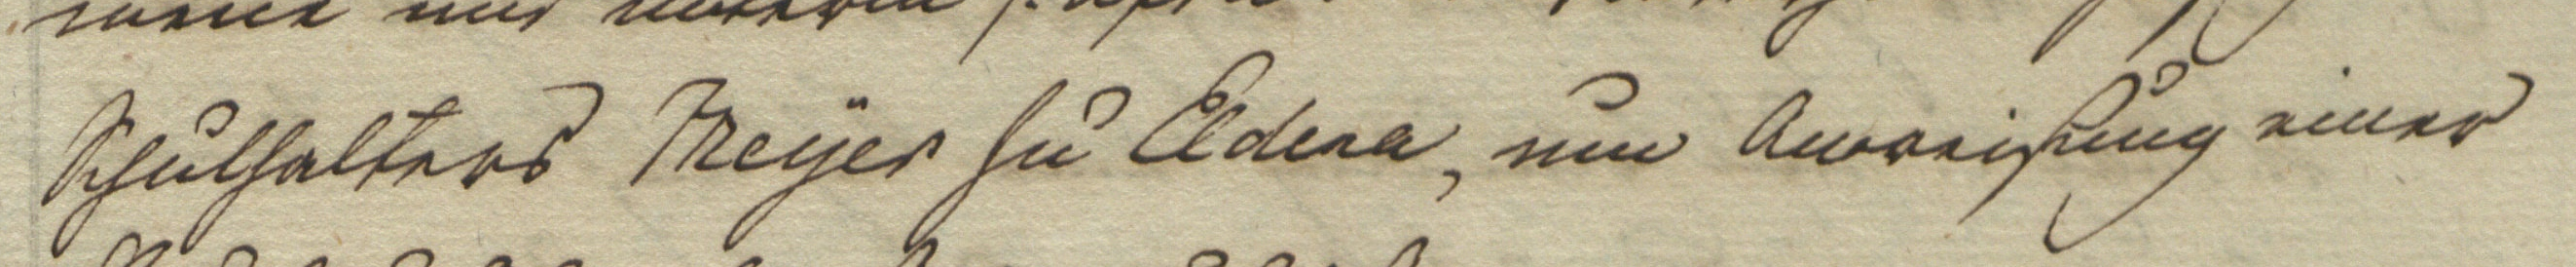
Schulhalters Meÿer zu Eldena, um Anweisung einer
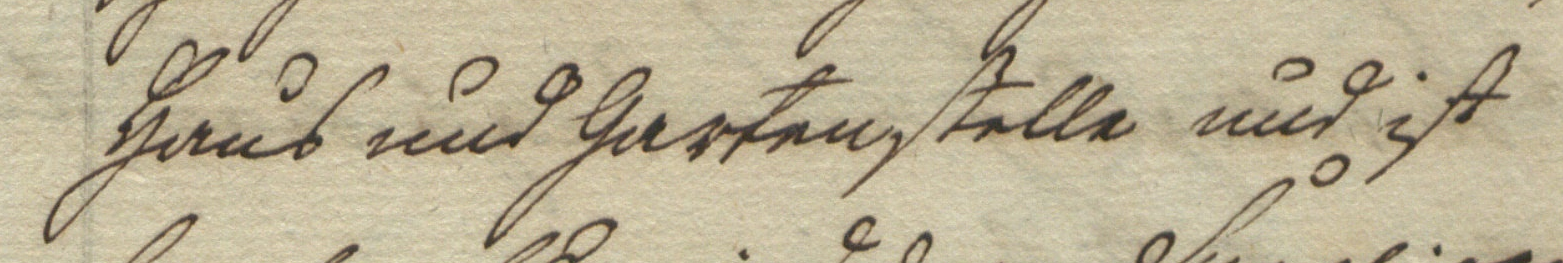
Haus und Gartenstelle und ist
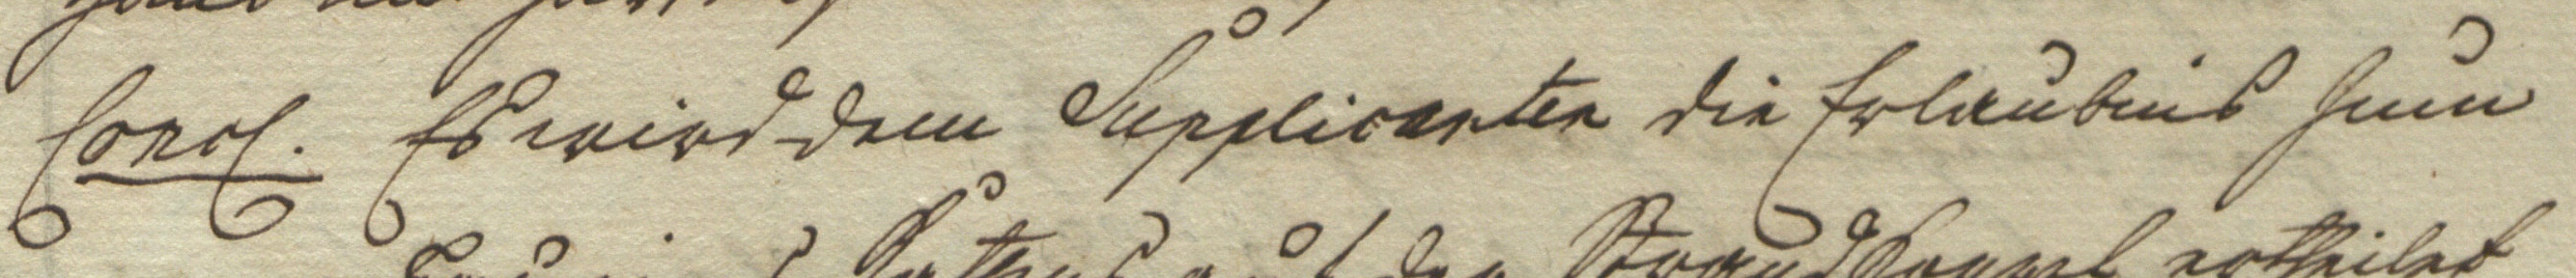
Concl. Es wird dem Supplicanten die Erlaubnis zum
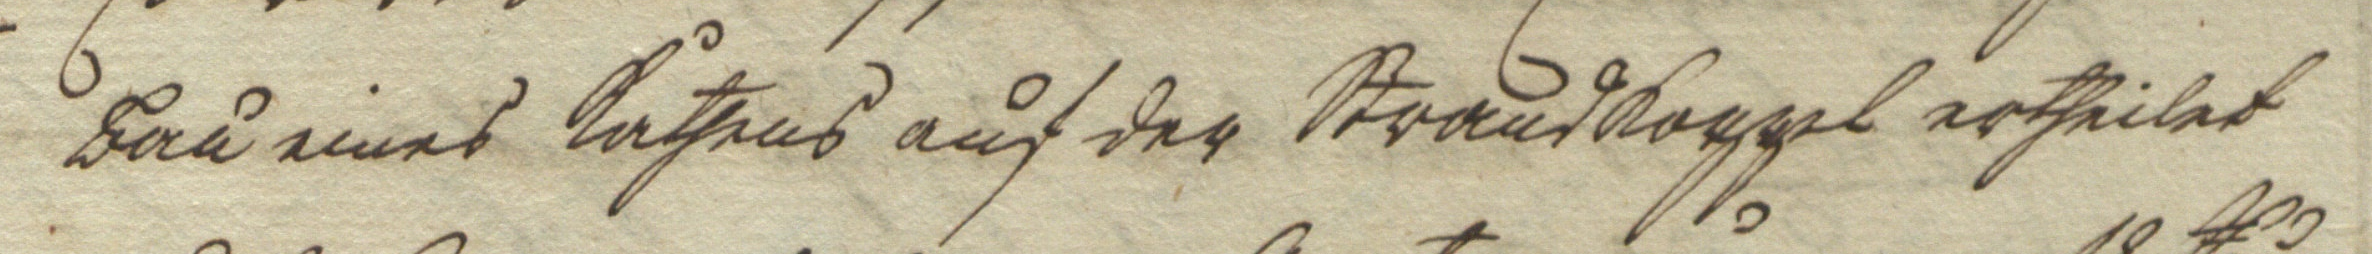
Bau eines Kathens auf der Strandkoppel ertheilet
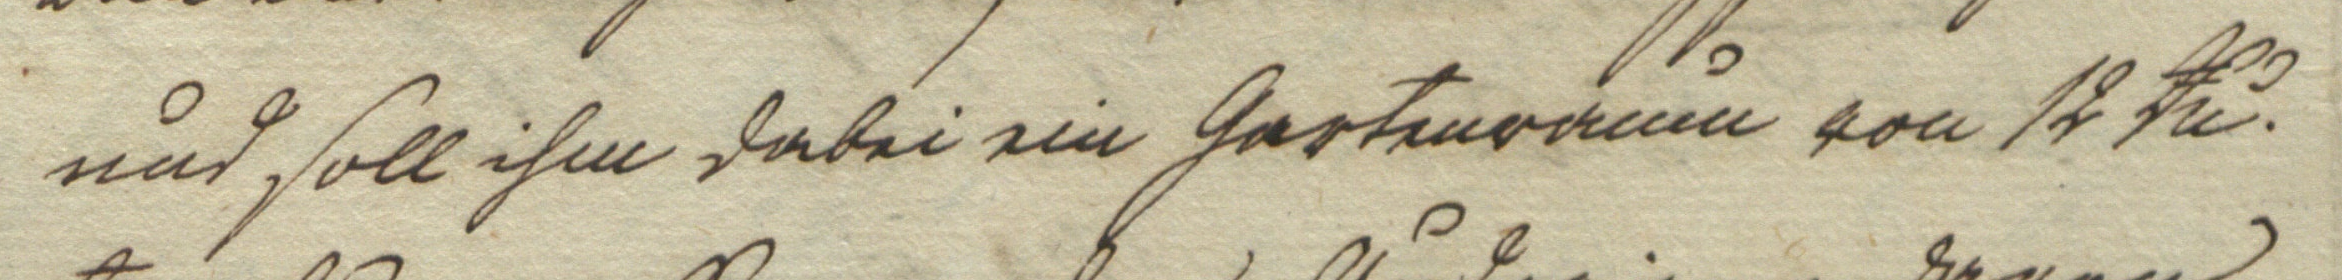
und soll ihm dabei ein Gartenraum von 12 Ru¬
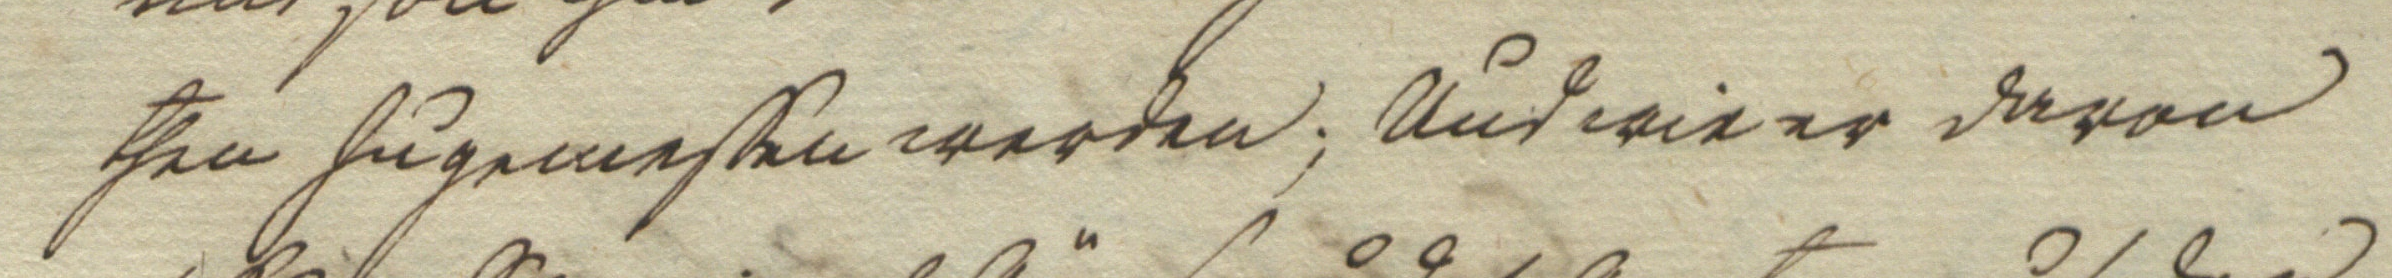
then zugemessen werden; Und wie er davon
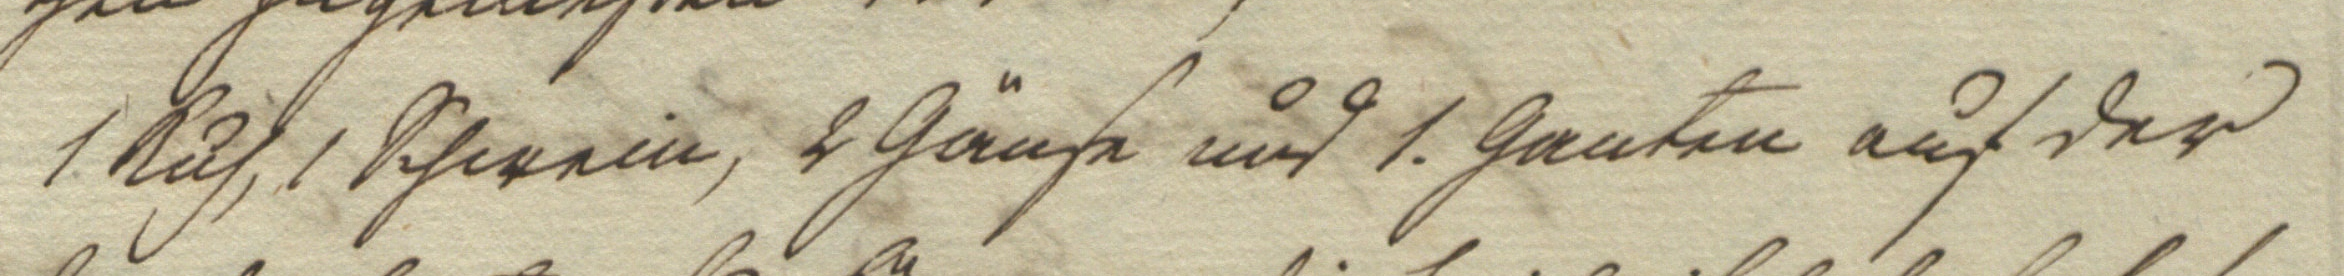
1 Kuh, 1 Schwein, 2 Gänse und 1. Ganten auf der
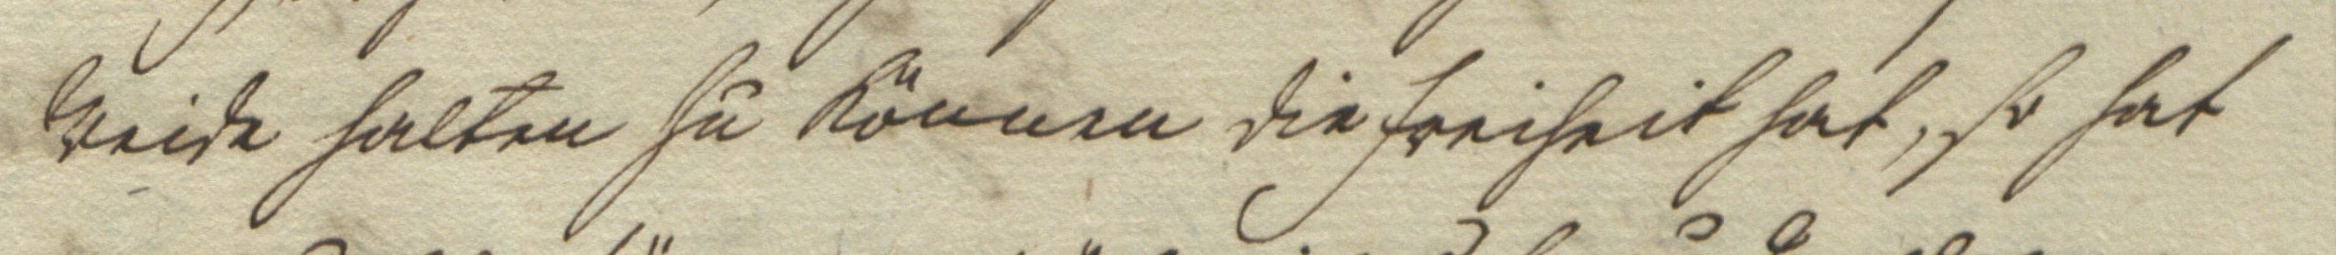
Weide halten zu können die Freiheit hat, so hat
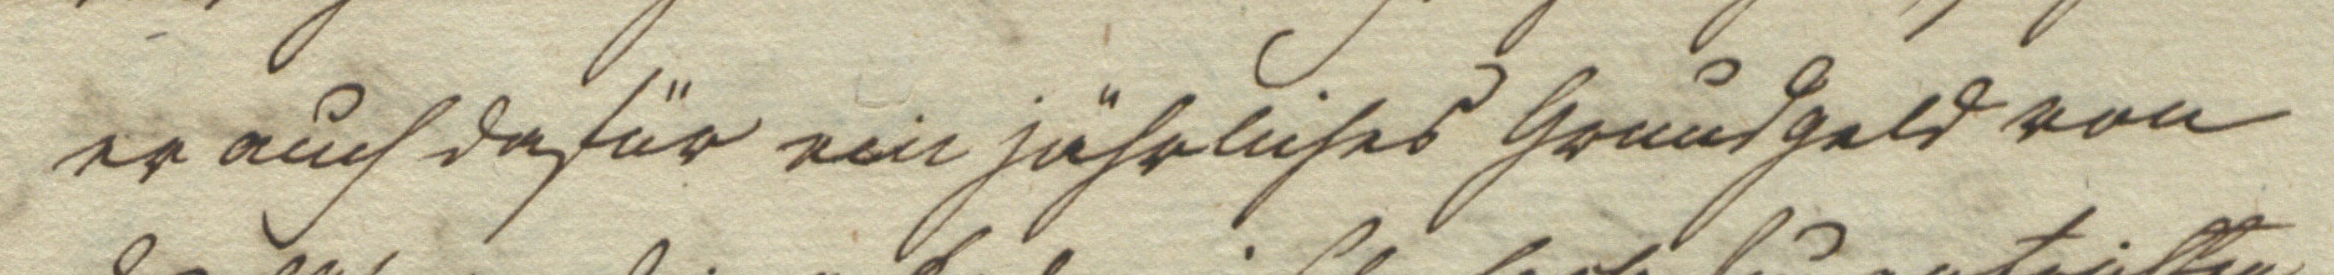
er auch dafür ein jährliches Grundgeld von
